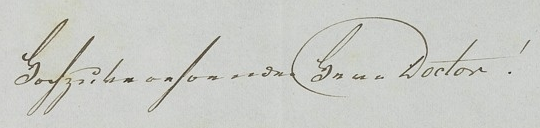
Hochzuverehrender Herr Doctor!
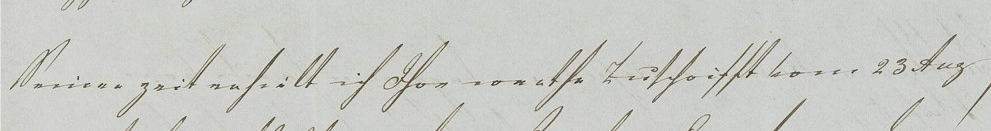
Seiner Zeit erhielt ich Ihre werthe Zuschrifft vom 23 Aug
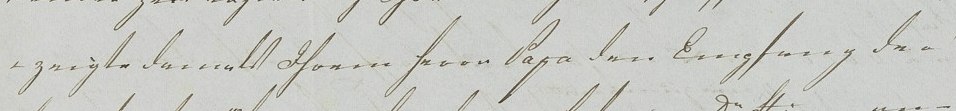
& zeigte damals Ihrem Herrn Papa den Empfang der
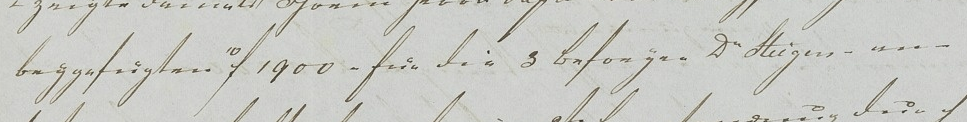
beygefügten f 1900 – für die 3 Befreyer DrSteiger – an
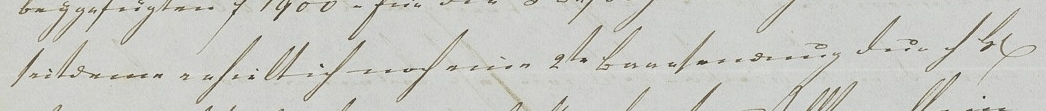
seitdem erhielt ich noch eine 2te Baarsendug durch Herrn
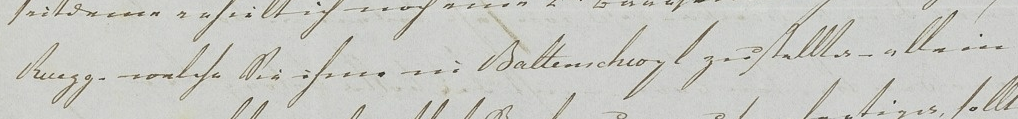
Ruegg – welche Sie ihm in Baltenschwyl zustellten – allein
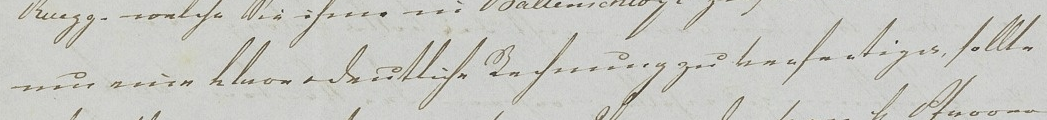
um eine klare & deutliche Rechnung zu verfertigen, sollte
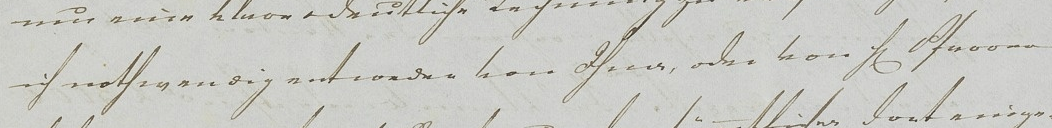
ich nothwendig entweder von Ihnen, oder von Herrn Pfarrer
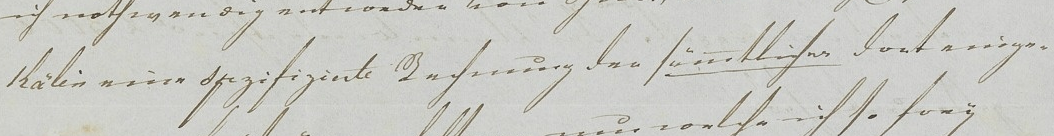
Kälin eine spezifizierte Rechnung der sämtlichen dort einge-
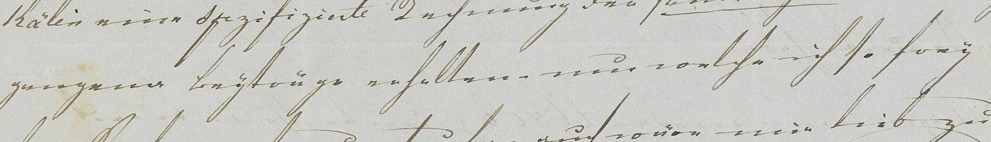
gangenen Beyträge erhalten – um welche ich so frey
